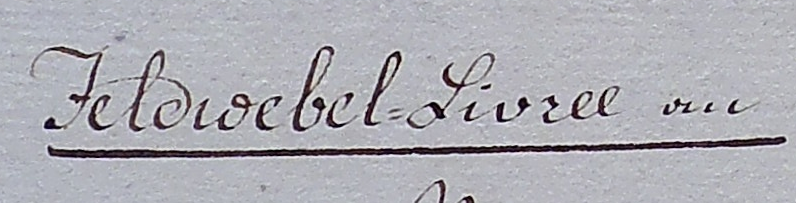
Feldwebel=Livree an
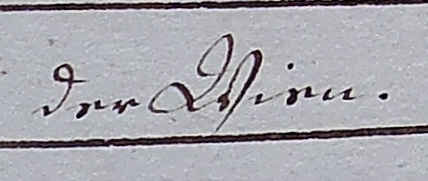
der Wien.
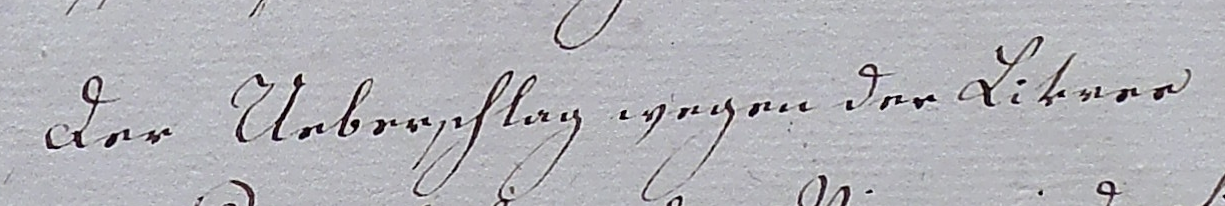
Der Ueberschlag wegen der Livree
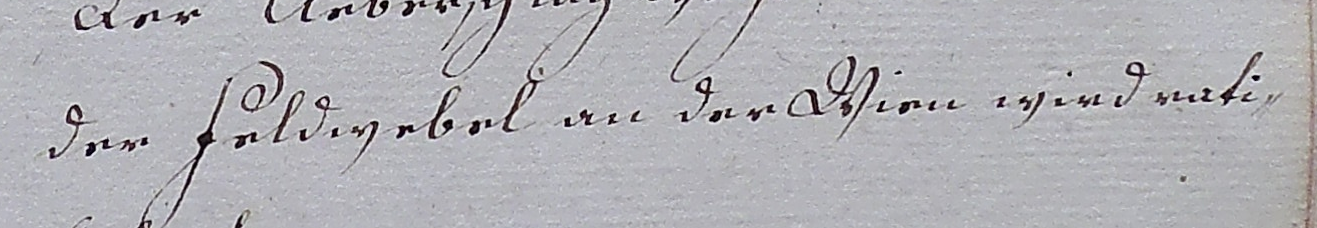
der Feldwebel an der Wien wird rati¬
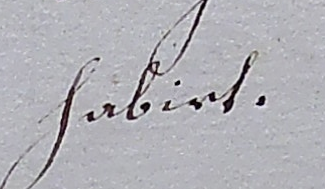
habirt.
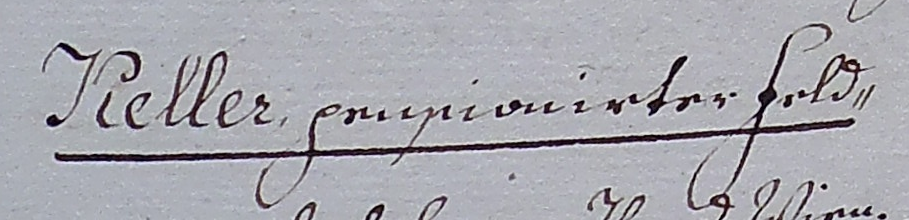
Keller, pensionirter Feld¬
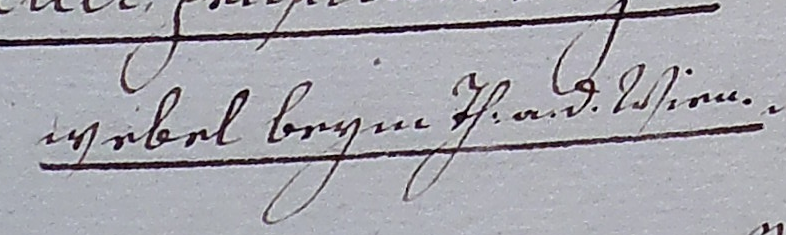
webel beym Th: a.d. Wien.
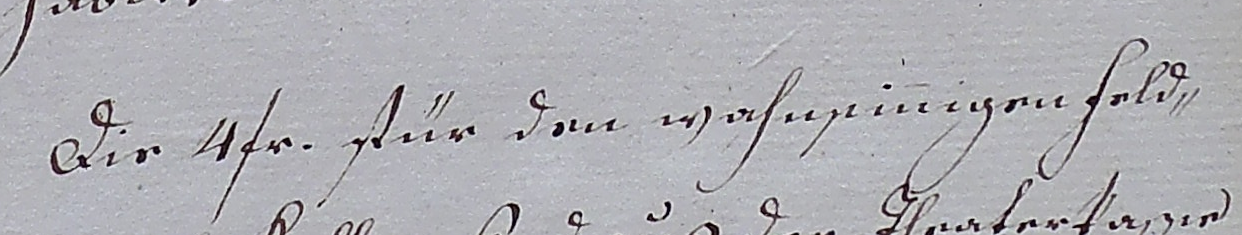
Die 4fr. für den wahnsin̅igen Feld¬
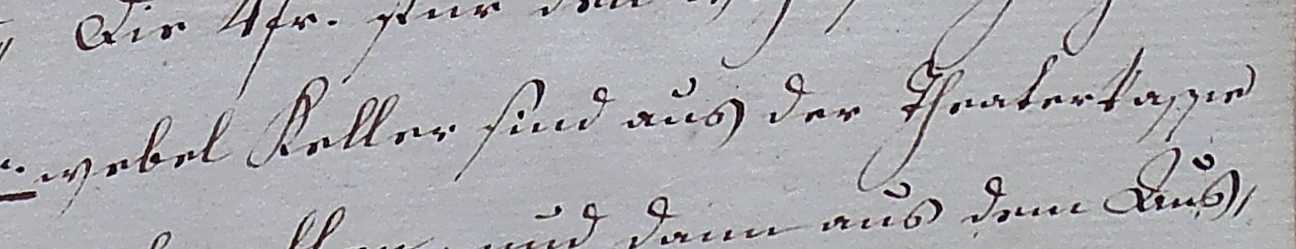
webel Keller sind aus der Theaterkase
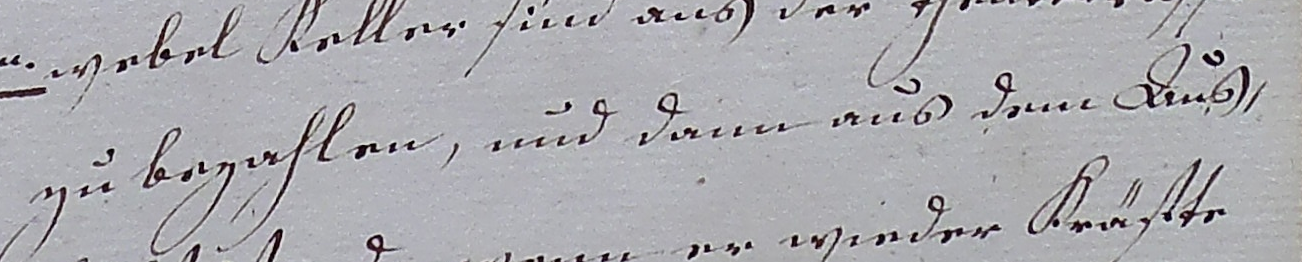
zu bezahlen, und dann aus dem Aus¬
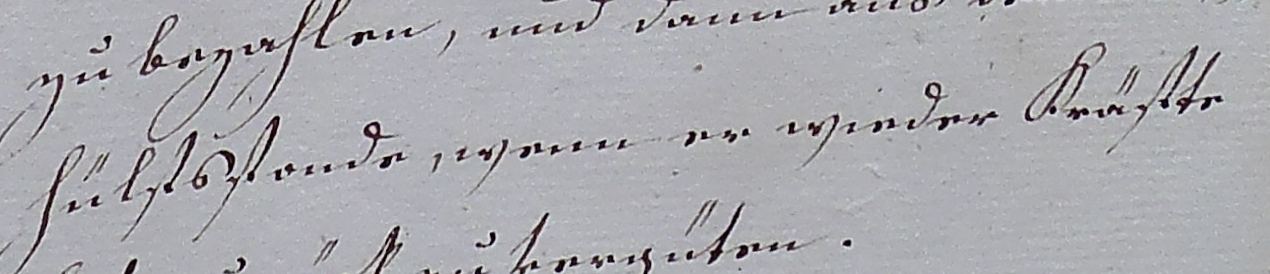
hülfsfonde, wenn er wieder Kräfte
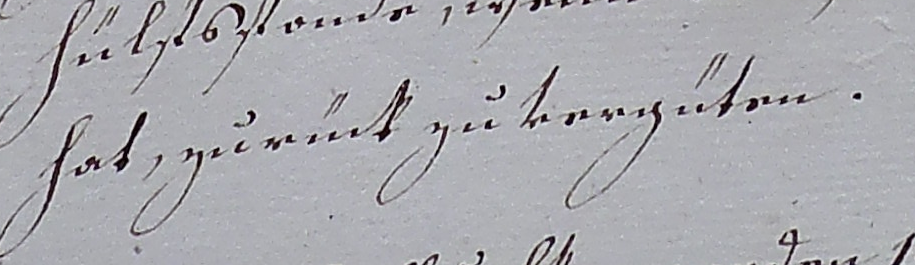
hat, zurück zu vergüten.
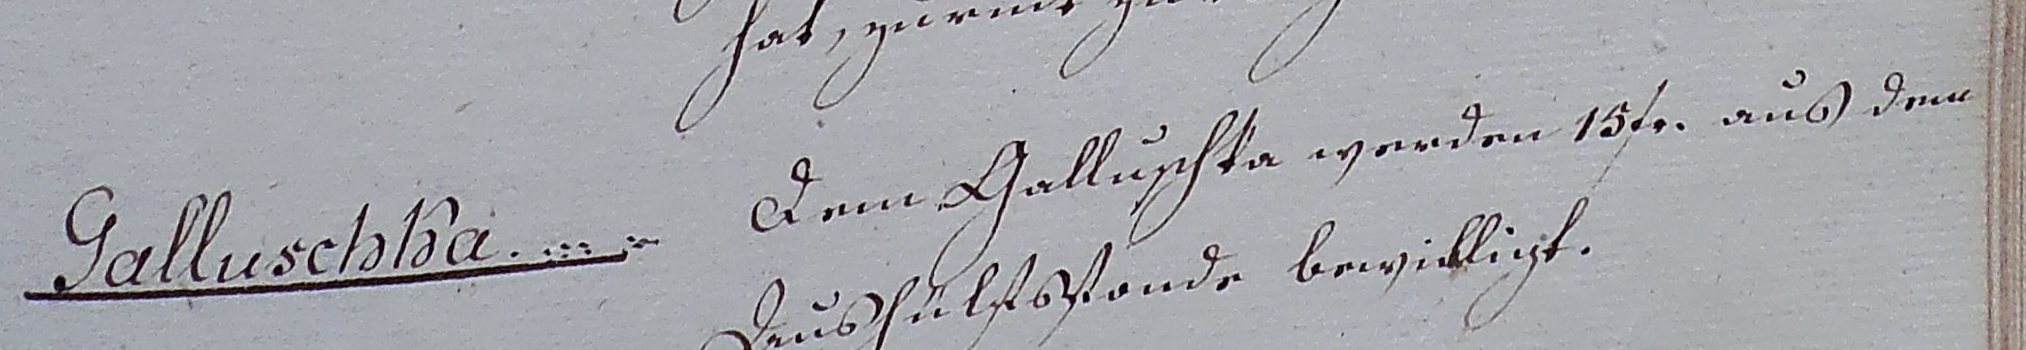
Galluschka. ... .. Dem Galluschka werden 15fr. aus dem
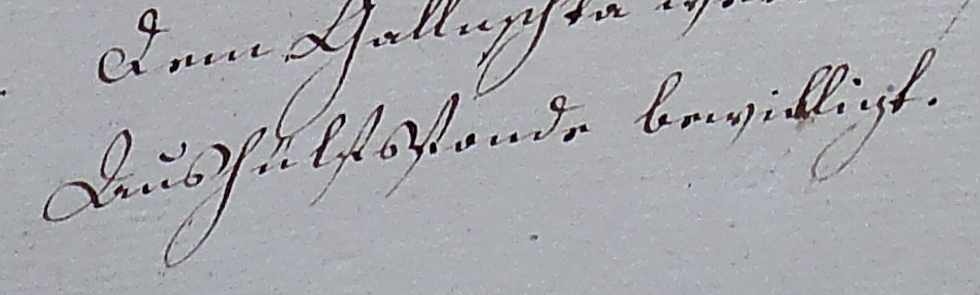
Aushülfsfonde bewilligt.
